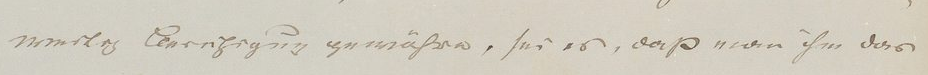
weitig Beruhigung gewähre, sei es, daß man ihm das
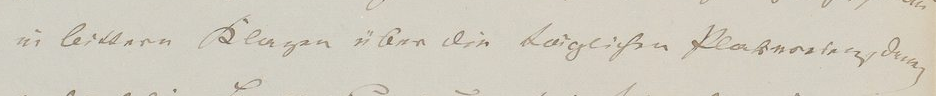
in bittern Klagen über die täglichen Plakereien, denen
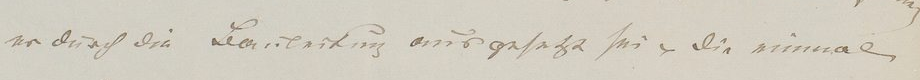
er durch die Bauleitung ausgesetzt sei u. die einmal
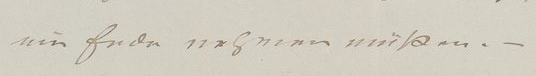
ein Ende nehmen müßen. –
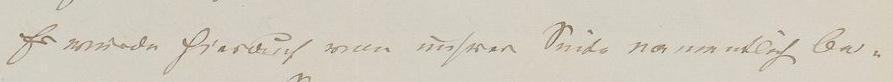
Es wurde hierauf von unsrer Seite namentlich be-
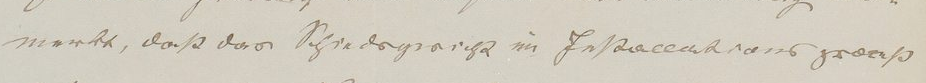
merkt, daß das Schiedsgericht im Installationsproceß
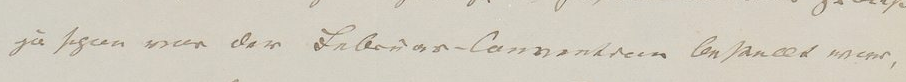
ja schon vor der Februar-Convention bestellt worden
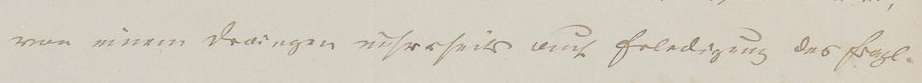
von einem Drängen unsrerseits auf Erledigung des fraglichen
